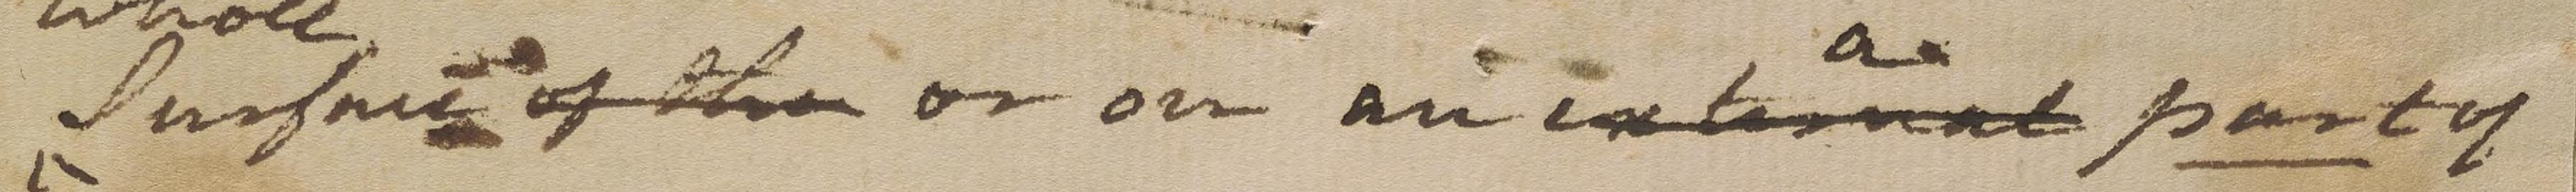Surface [of the] or on an [external] party
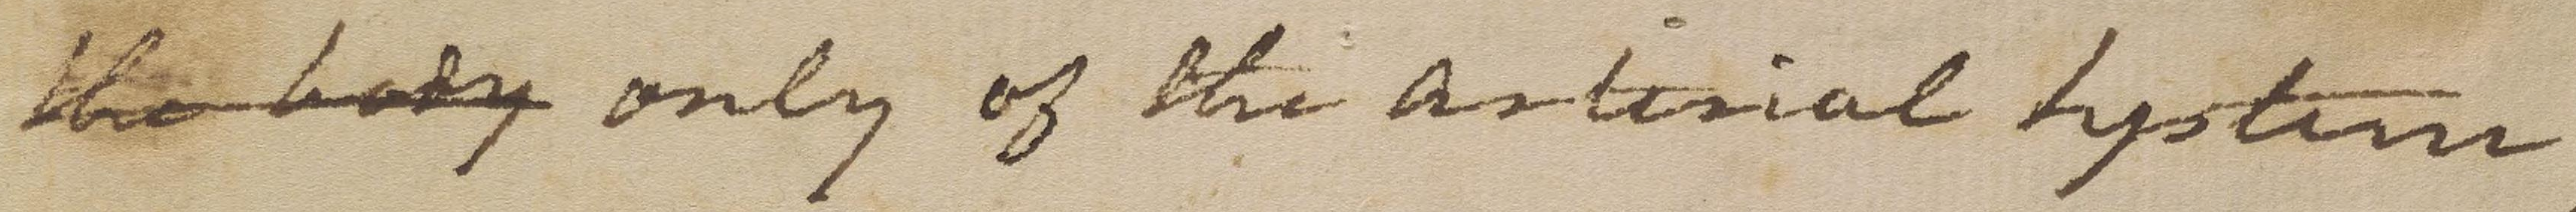[the body] only of the arterial system
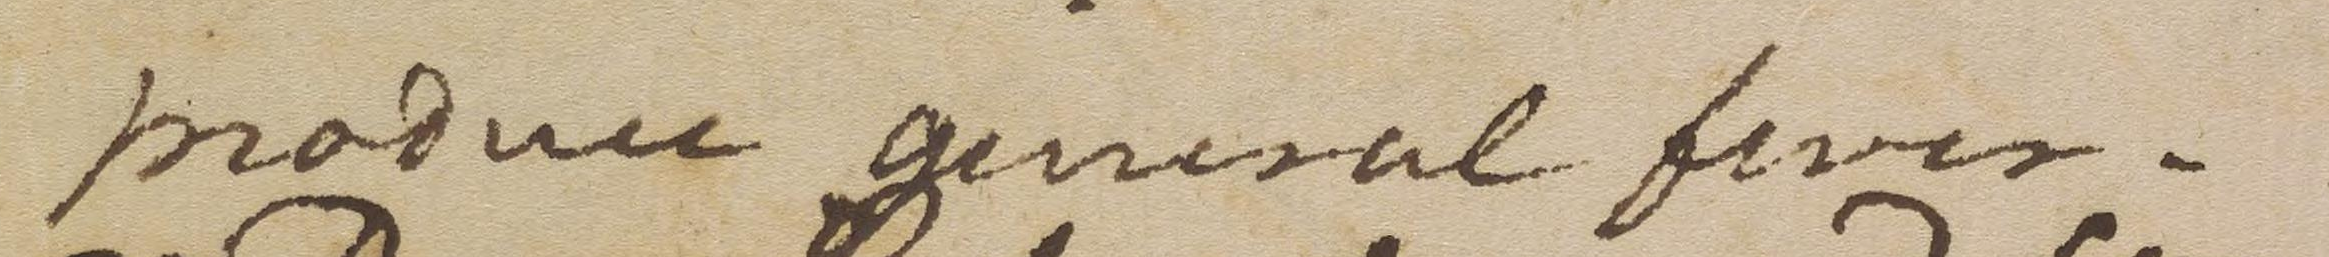produce general fever
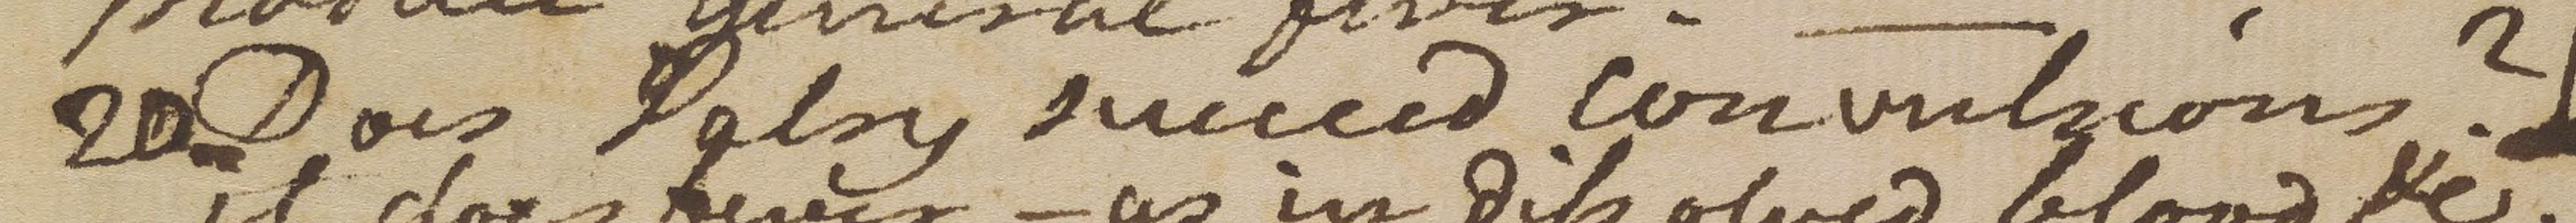20. Does Palsy succeed convulsions?
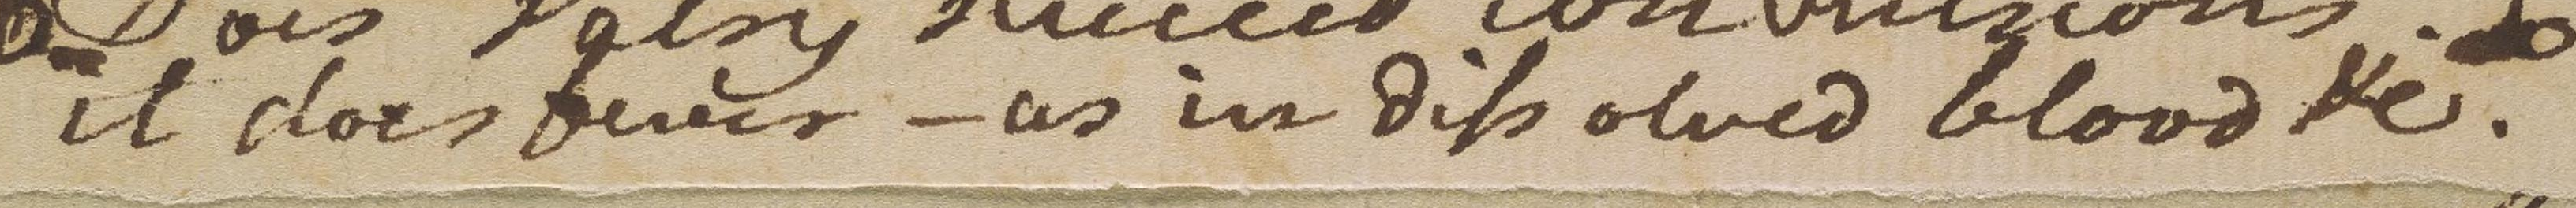it does fever- as in dissolved blood &c.
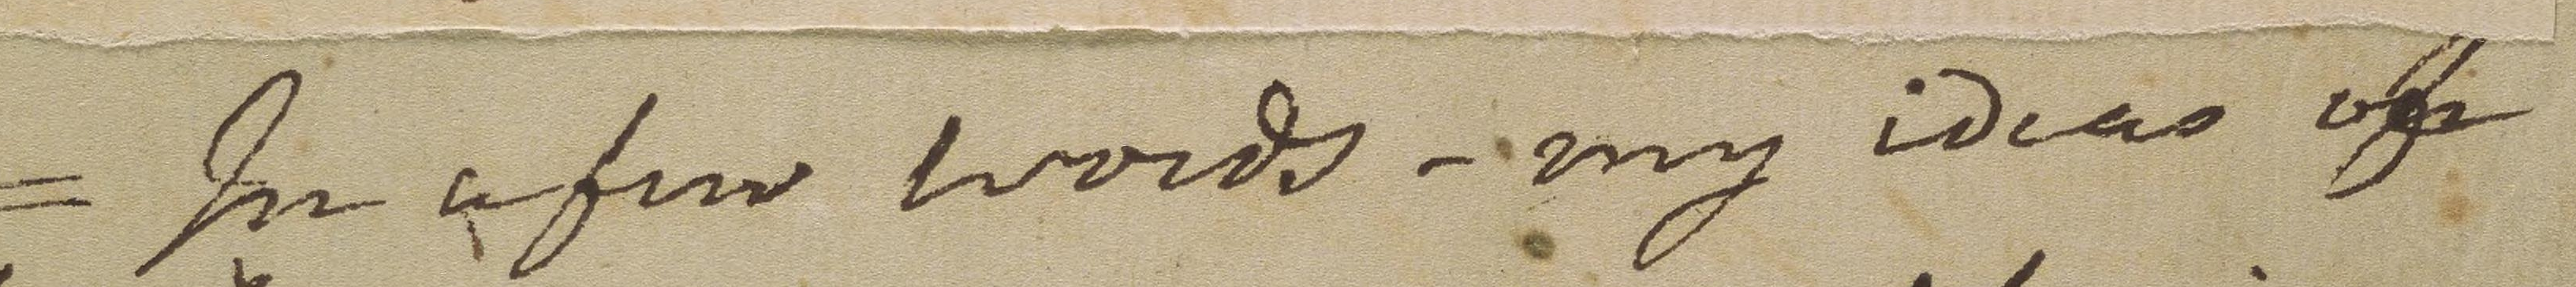In a few words, my ideas of
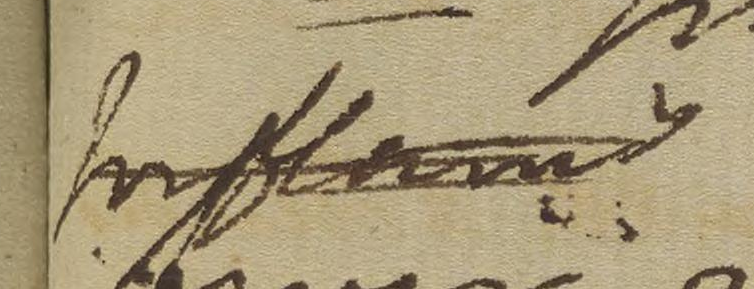[Inflamm^y]
